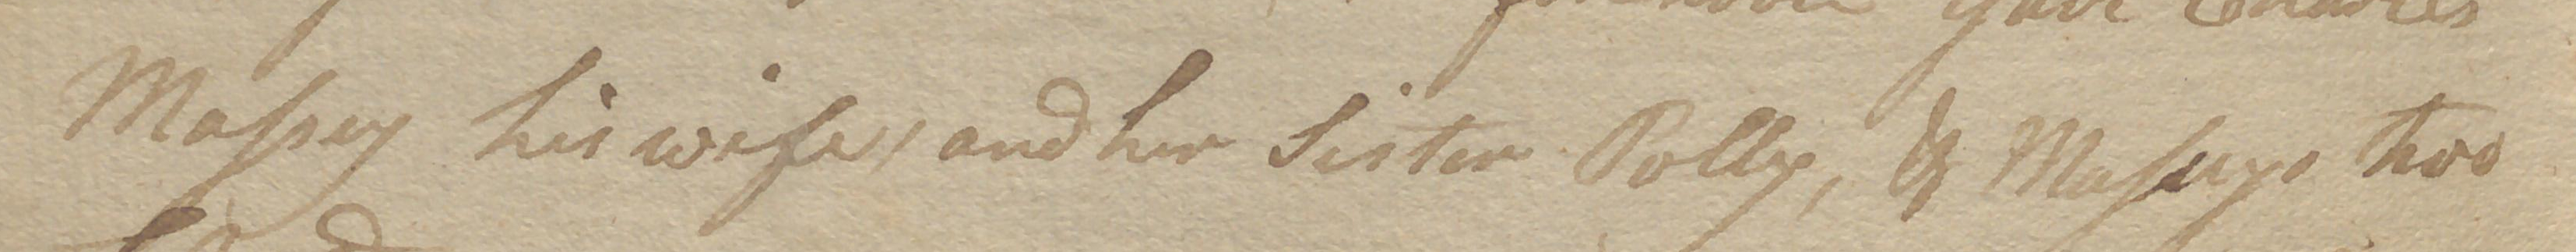Massey his wife, and her Sister Polly, & Masseys two
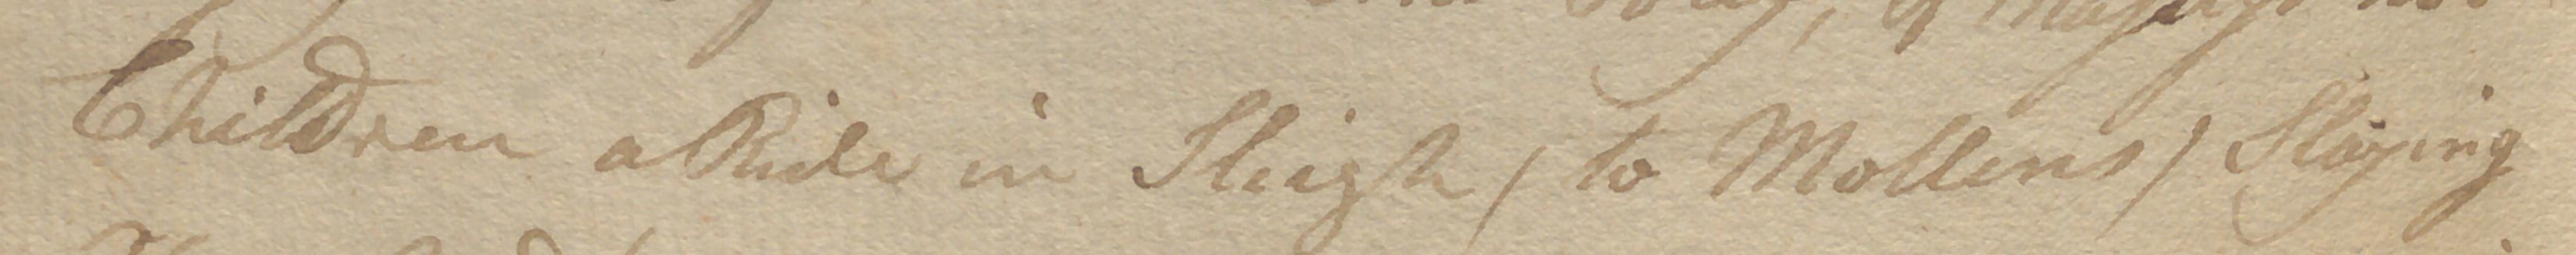Childsen a Ride in Sleigh (to Mollins) Slaying
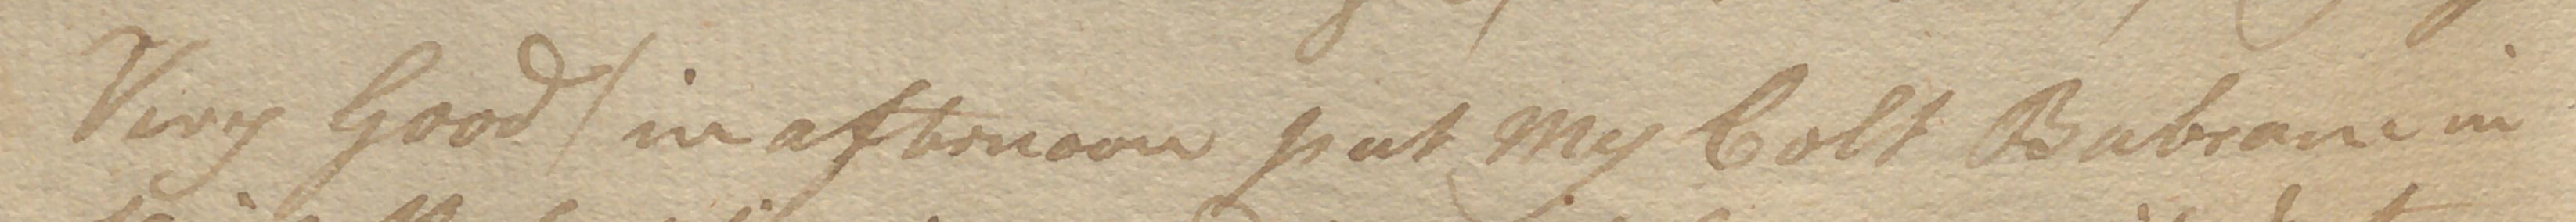Very Good / in afternoon put My Colt Babram in
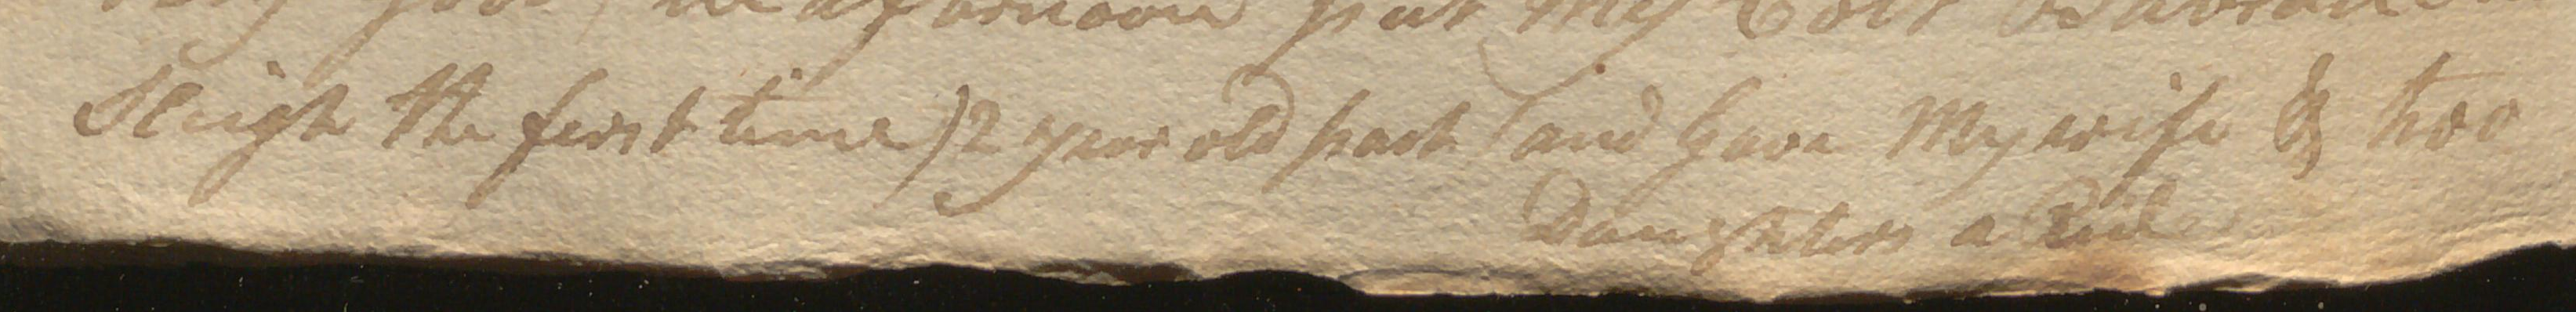Sleigh the first time) two years old past and gave my wife & two
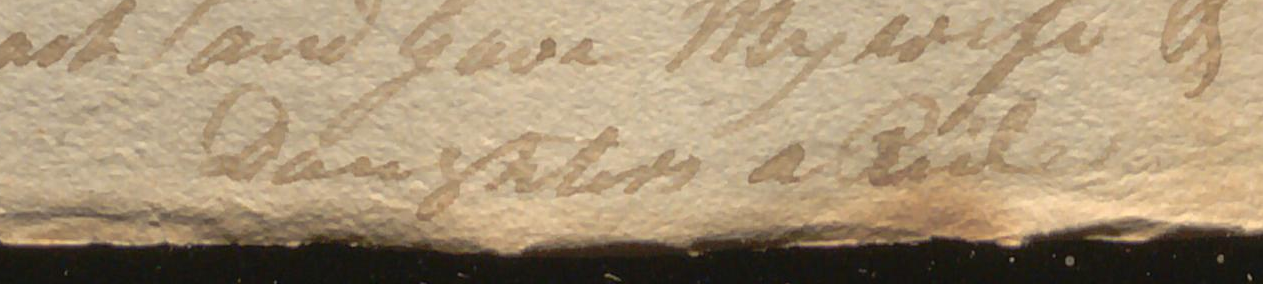Daughters a Ride
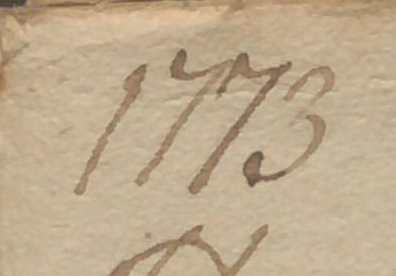1773
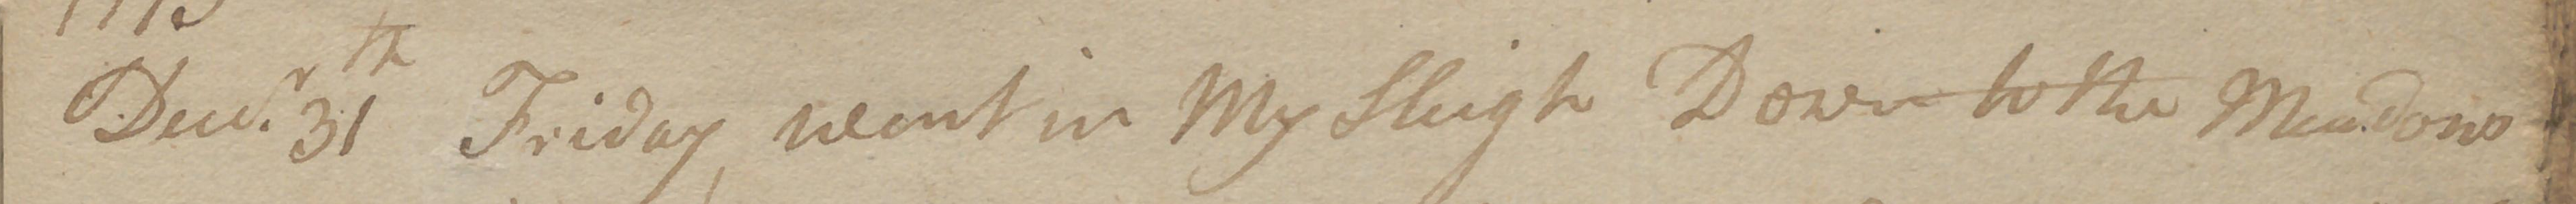Dece^r. 31^th Friday, went in My Sleigh Down to the Meadows
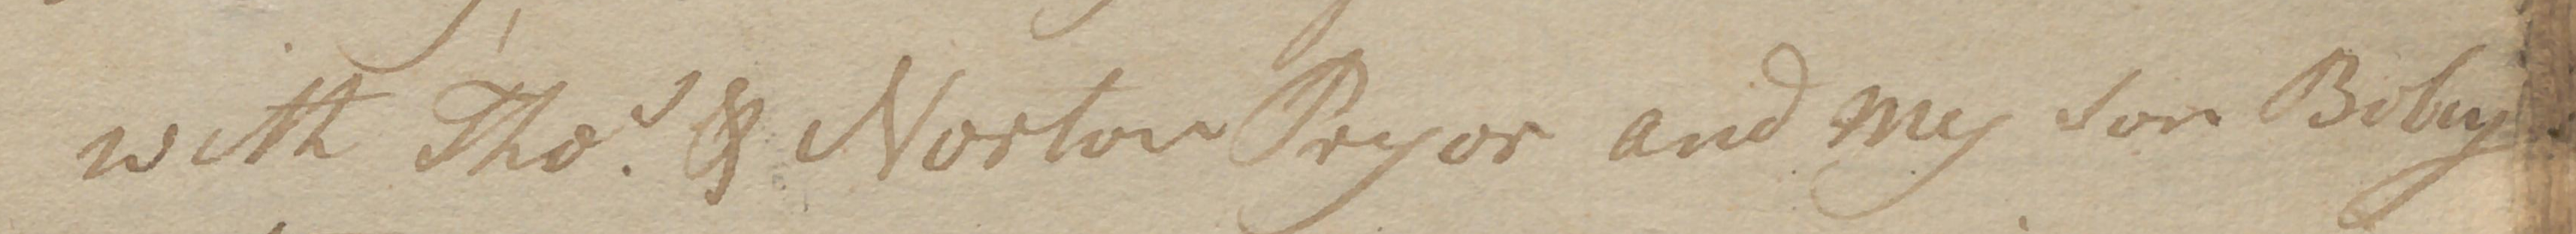with Tho^s. & Norton Pryor and my son Bobey
